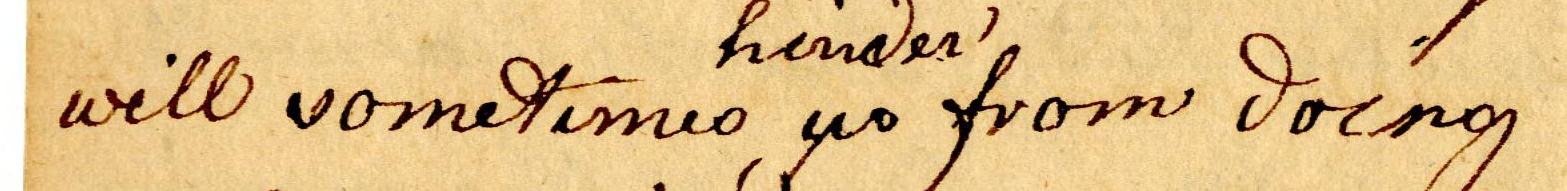will sometimes ^ us from doing
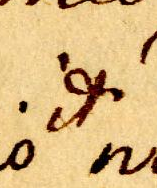it
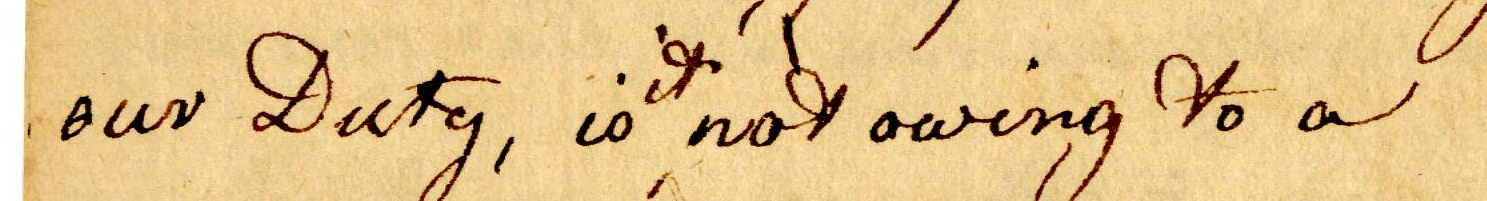our Duty, is ^ not owing to a
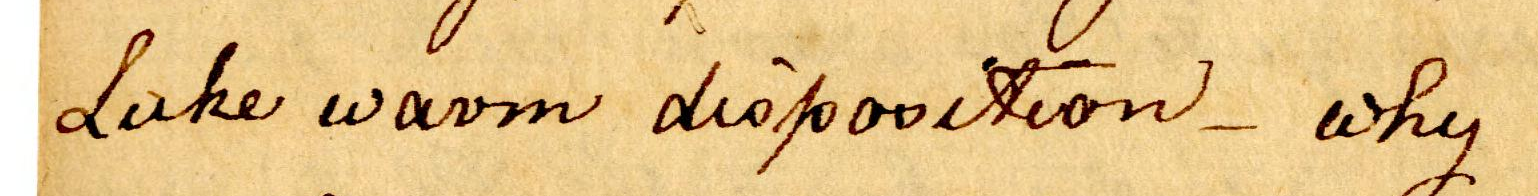Luke warm disposition- why
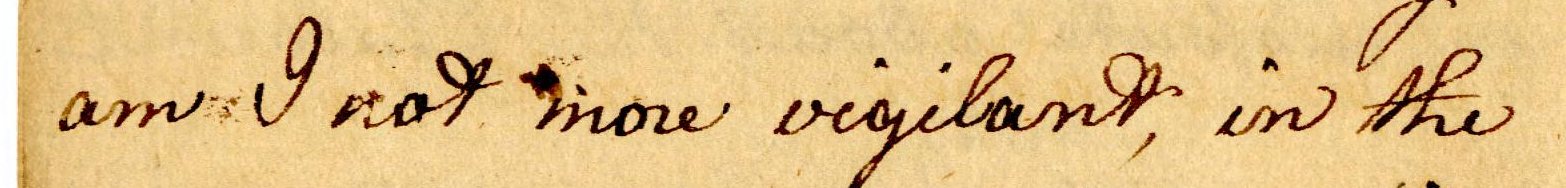am I not more vigilant, in the
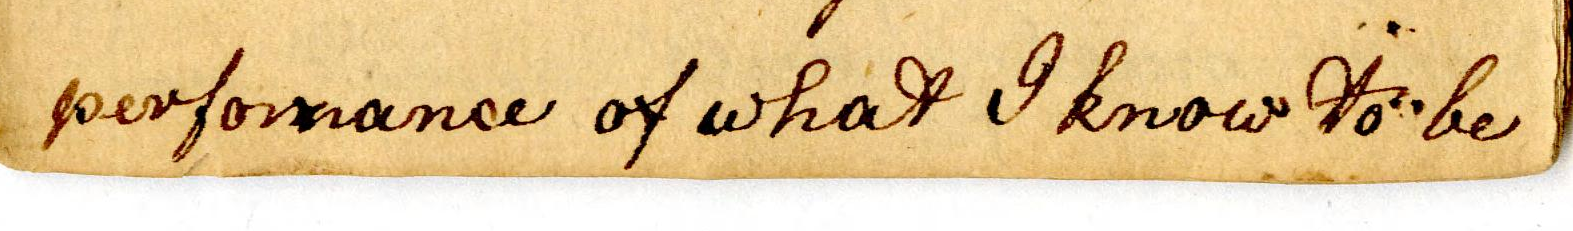performance of what I know to be
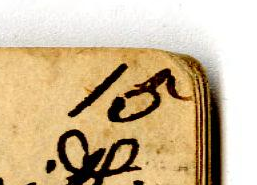15
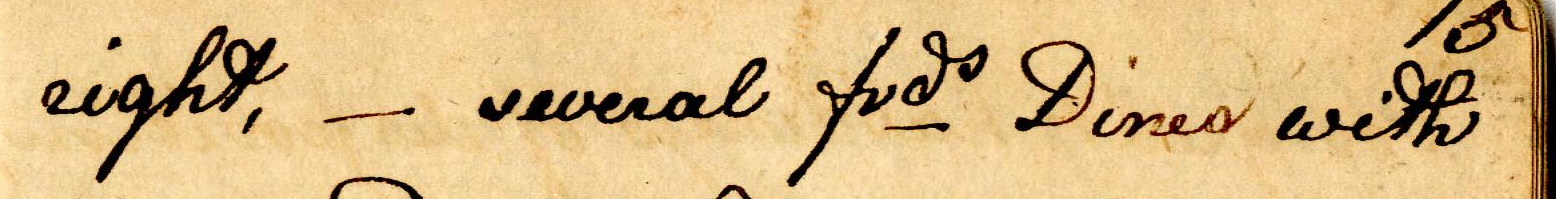right,- several frd^s Dined with
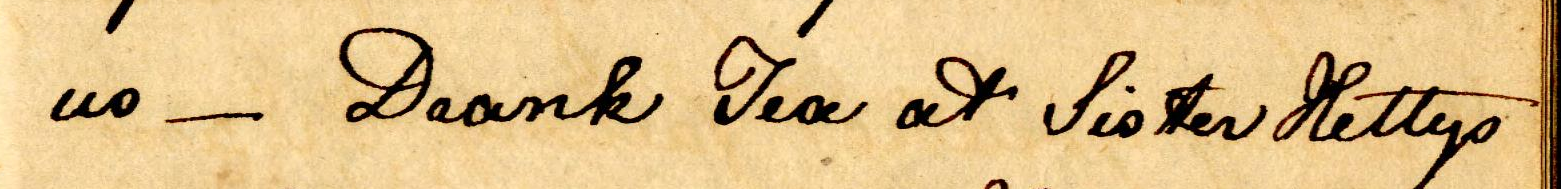us- Drank Tea at Sister Hettys
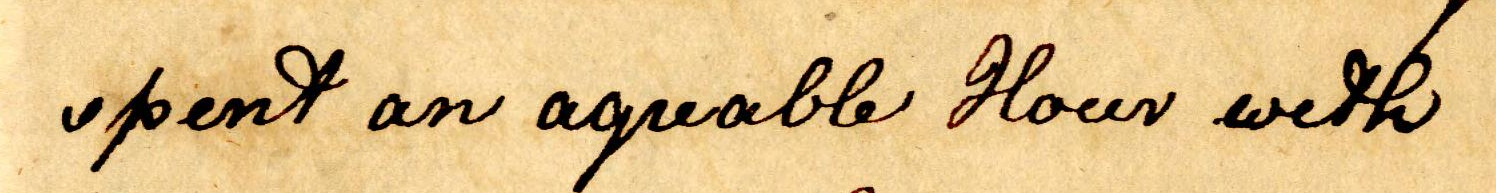spent an agreable Hour with
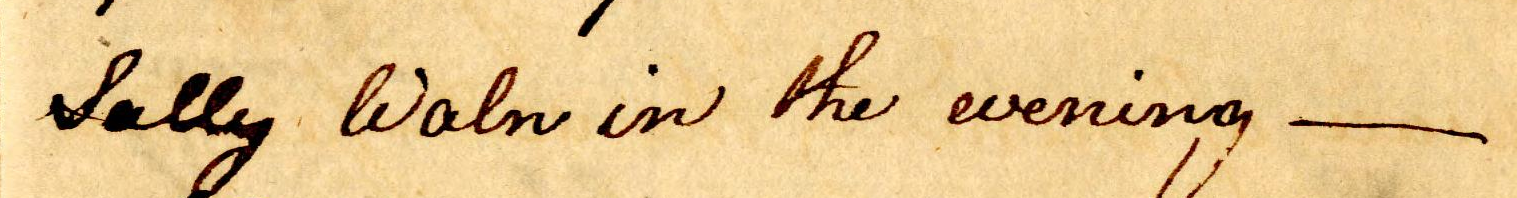Sally Waln in the evening-
